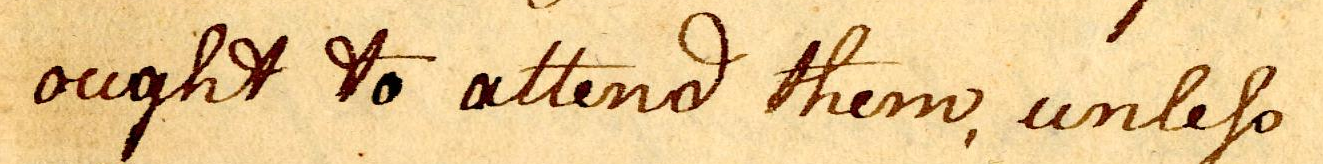ought to attend them, unless
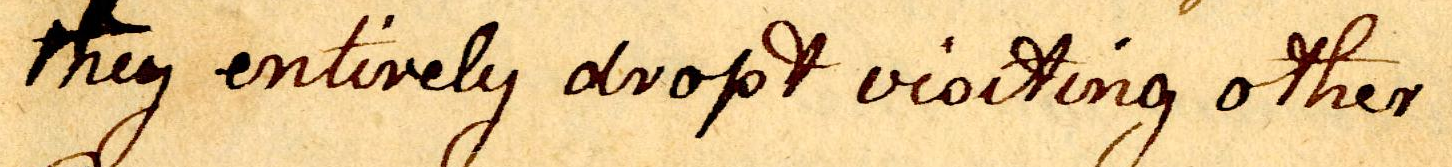they entirely dropt visiting other
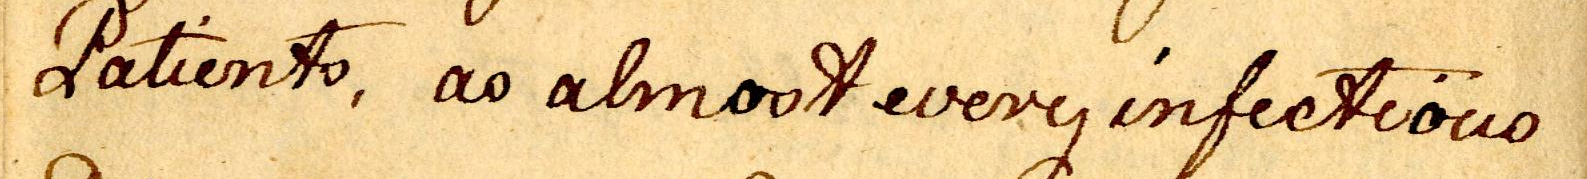Patients, as almost every infectious
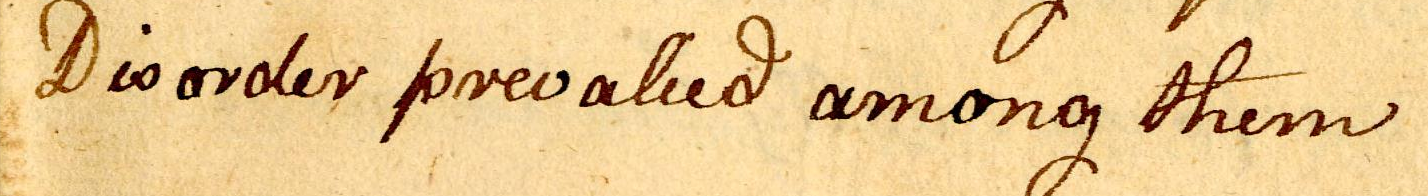Disorder prevalied among them
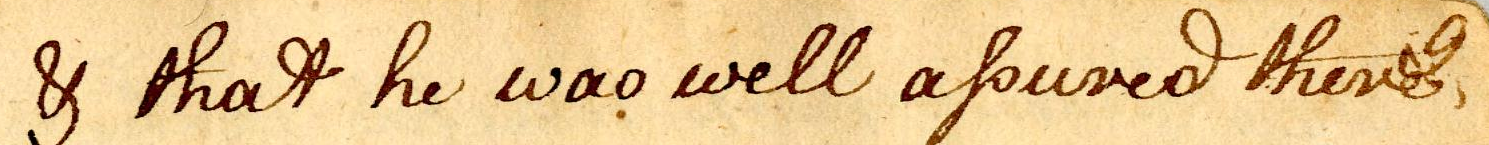& that he was well assured there 9
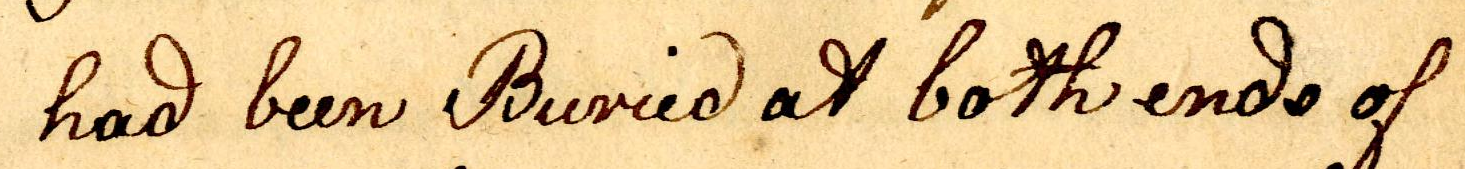had been Buried at both ends of
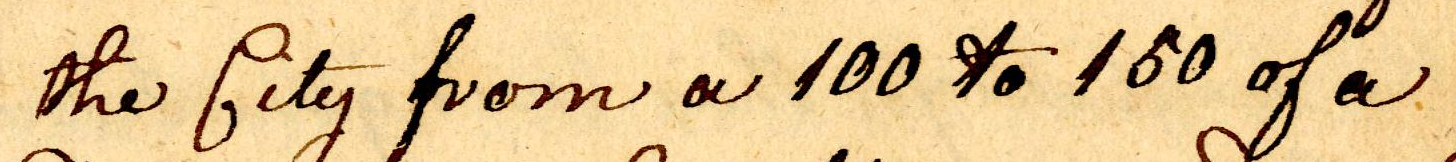the City from a 100 to 150 of a
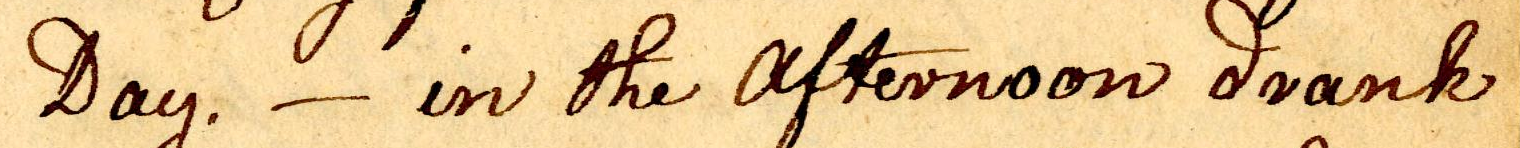Day.- in the Afternoon drank
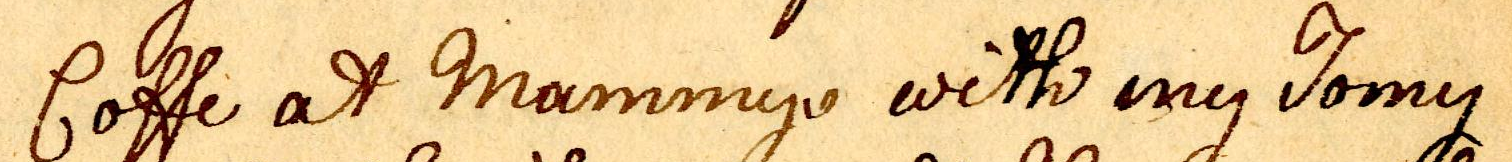Coffe at Mammys with my Tomy
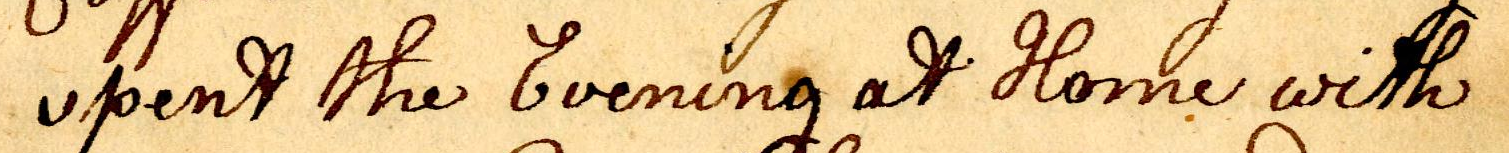spent the Evening at Home with
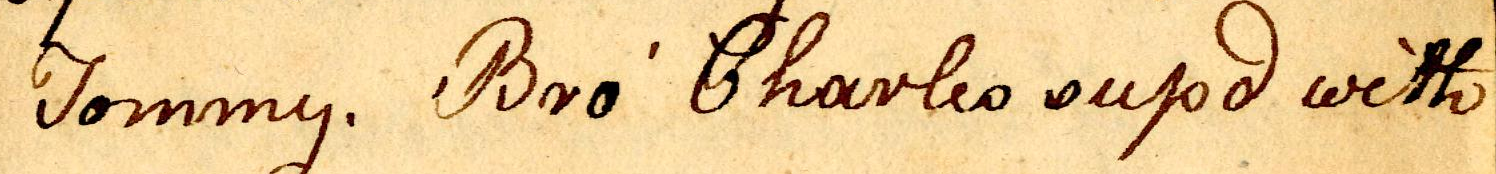Tommy. Bro' Charles supd with
